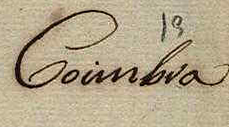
Coimbra
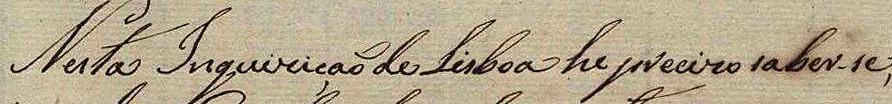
Nesta Inquiziçaõ de Lisboa he precizo saber-se,
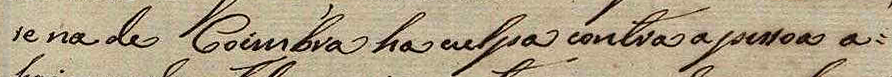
se na de Coimbra ha culpa contra a pessoa a
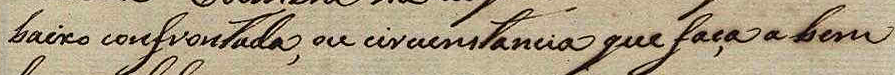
baixo confrontada, ou circunstancia que faça a bem
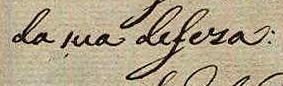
da sua defeza:
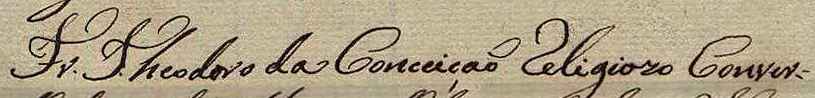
Fr. Theodoro da Conceiçaõ Religiozo Conver
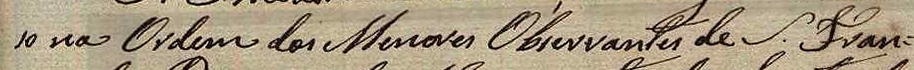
so na Ordem dos Menores Observantes de S. Fran
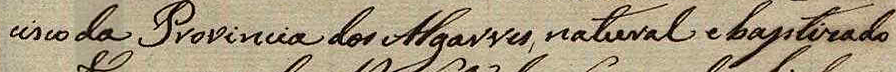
cisco da Provincia dos Algarves, natural e baptizado
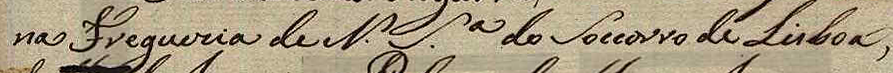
na Freguezia de N. S.a do Soccorro de Lisboa,
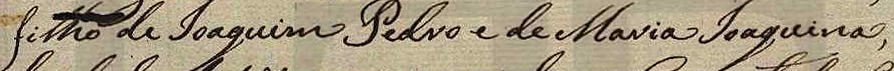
filho de Ioaquim Pedro e de Maria Ioaquina,
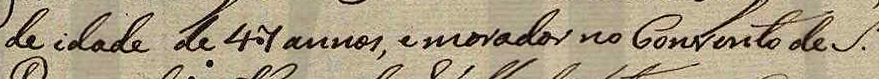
de idade de 47 annos, e morador no Convento de S.
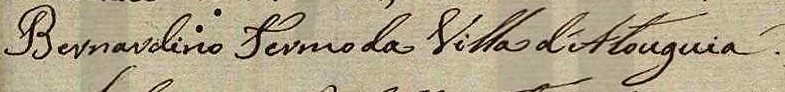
Bernardino Termo da Villa d'Atouguia.
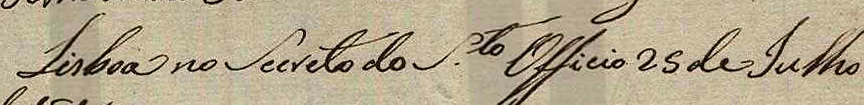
Lisboa no Secreto do S.to Officio 25 de Iulho
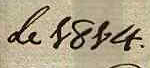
de 1814.
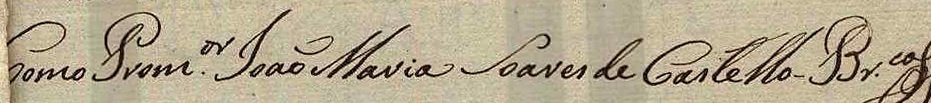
Como Prom.or Ioaõ Maria Soares de Castello-Br.co
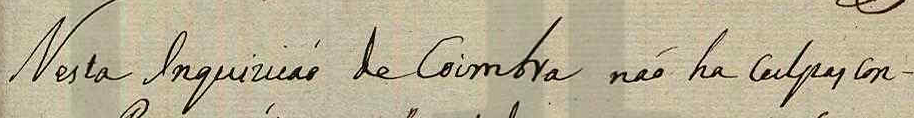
Nesta Inquiziçaõ de Coimbra naõ ha culpas con
